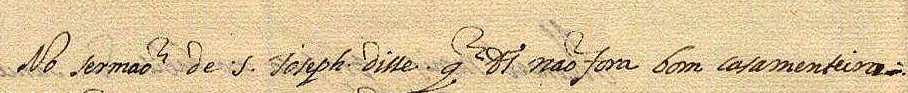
No sermaõ de .S. Ioseph disse q̄ Ds̄ naõ fora bom casamenteiro
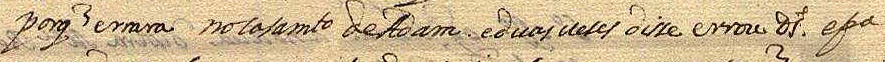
porq̄ errara no casamto de Adam e duas ueses disse errou Ds̄ e pa
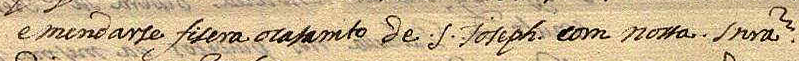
emendarse fisera o casamto de S. Ioseph. com nossa snrā.
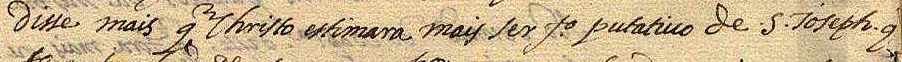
disse mais q̄ Christo estimara mais ser fo putatiuo de S. Ioseph q̄
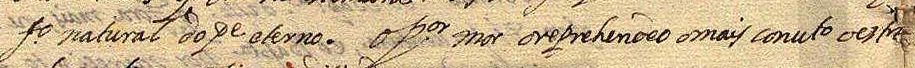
f.o natural do Pe eterno. o p.or mor o reprehendeo o mais conuto o estra
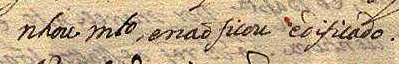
nhou mto, e não ficou edificado.
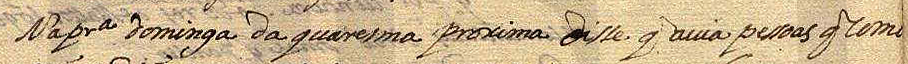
Na pra dominga da quaresma proxima disse q̄ auia pessoas q̄ como
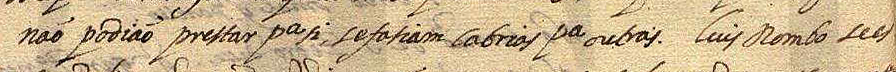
naõ podiaõ prestar pa si, se fasiam cabrias pa outras. Luis Rombo se es
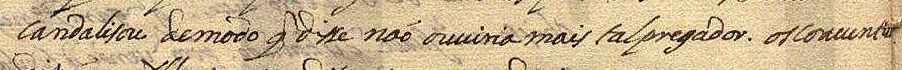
candalizou de modo q̄ disse naõ ouuiria mais tal pregador. os conuentu
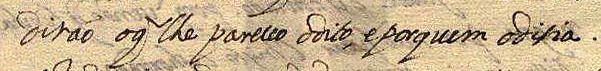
diraõ o q̄ lhe pareceo o dito, e por quem o disia.
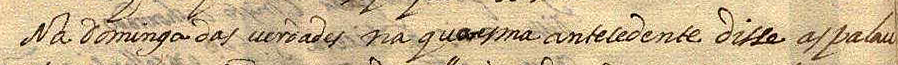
Na dominga das uerdades na quaresma antecedente disse as palau
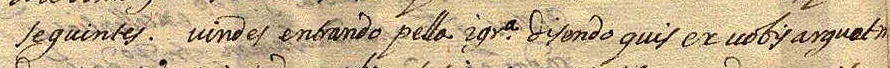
seguintes. uindes entrando pella igra. disendo quis ex uobis arguet
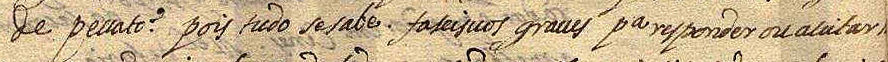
de peccato? pois tudo se sabe. faseiuos graues pa responder ou aceitar
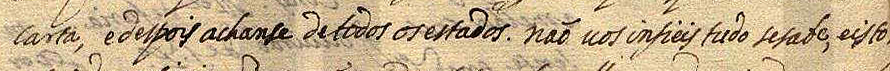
carta, e despois achanse de todos os estados, naõ uos infieis tudo se sabe, e isto
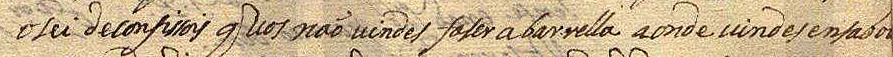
o sei de confissois q̄ uos naõ uindes faser a barrella aonde uindes ensabo
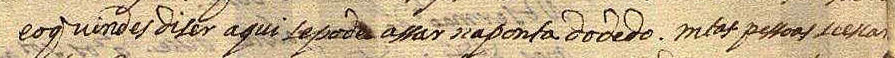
e o q̄ uindes diser aqui se pode assar na ponta do dedo. mtas pessoas se esca
